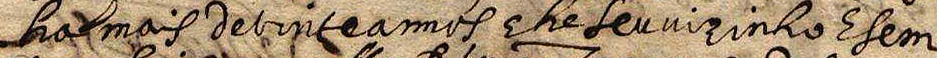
ha mais de vinte annos e he seu uizinho E sem
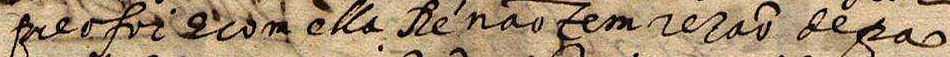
pre o foi E com ella Ré não tem rezaõ de pa
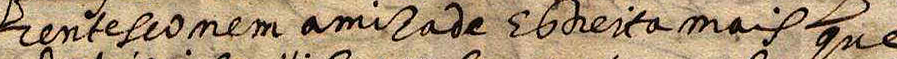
rentesco nem amizade Estreita mais que
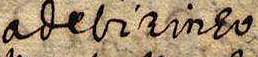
a de vizinho
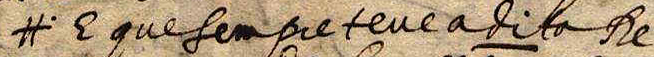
E que sempre teue a dita Ré
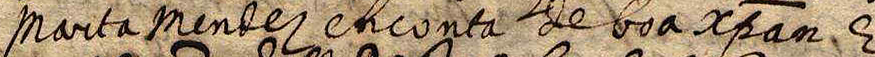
Marta Mendez en conta de boa xp̄am E
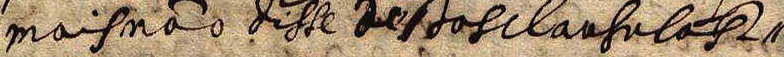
mais não disse destas clausulas // -
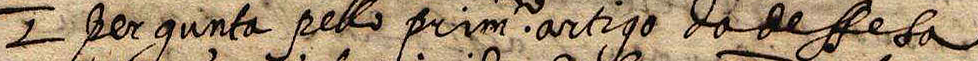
item pergunta pello primro. artigo da deffesa
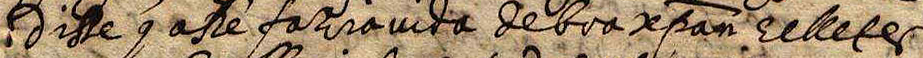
disse q̄ a Ré fazia uida de boa xp̄an E elle tes
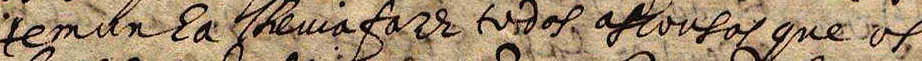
temunha lhe uia fazer todas as cousas que os
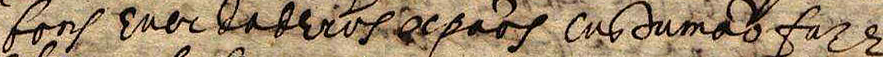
bons E uerdadeiros xpaõs custumão fazer
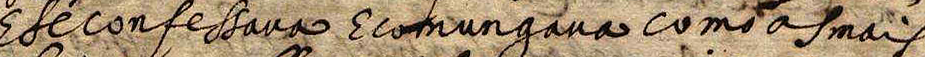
E se confessaua E comungaua como as mais
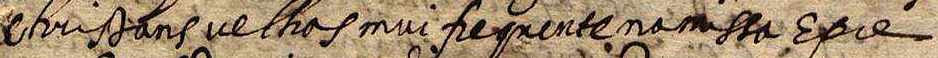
christans uelhas mui frequente na missa E pre
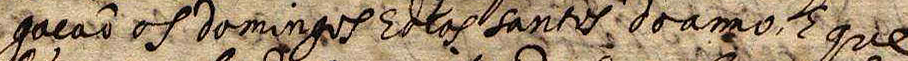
gaçaõ os domingos E dias santos do anno. E que
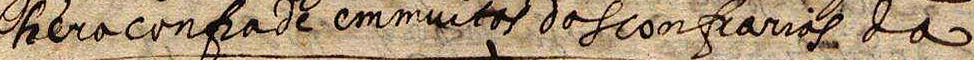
hera confrade em muitas das confrarias da
